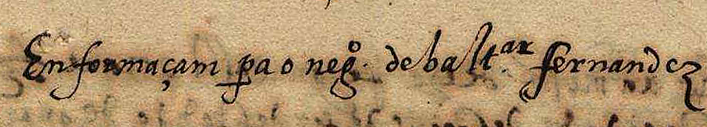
Enformaçam ꝑa o nego. de balt.ar fernandez
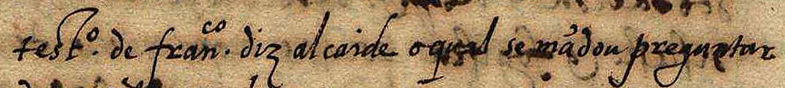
testo. de fran.co diz alcaide o qual se mādou preguntar
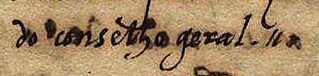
do conselho geral. //
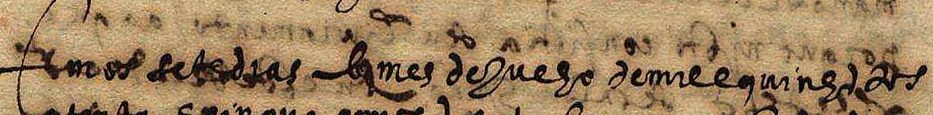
Em os sete dias do mes de Julho de mill e quinhētos
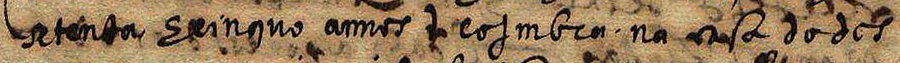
setenta E cinquo annos ē coJmbra na casa do des
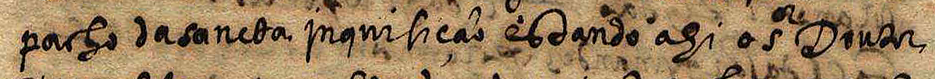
pacho da sancta jnquisiçaõ estando ahi o sor Doutor
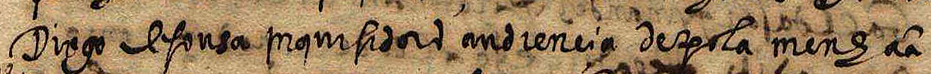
Diogo de sousa jnquisidor ē audiencia de pola menhaã
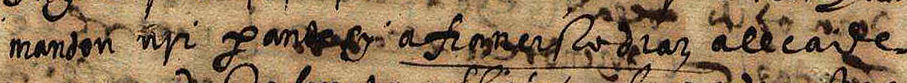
mandou ujr ꝑante sy a francisco diaz allcaide
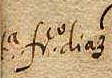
ta. fr.co diaz
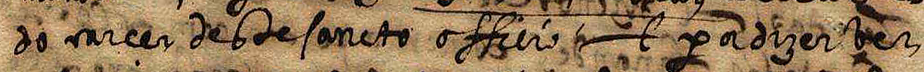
do carcer deste sancto officio E ꝑa dizer ver
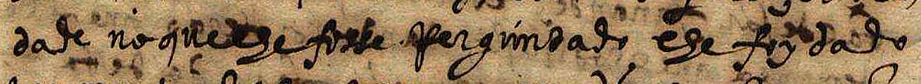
dade no que lhe fosse perguntado lhe foy dado
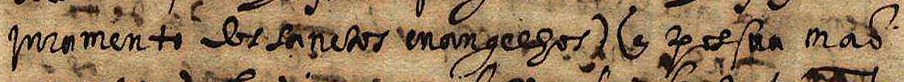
juramento dos sanctos euangelhos ē q̄ pos sua maõ
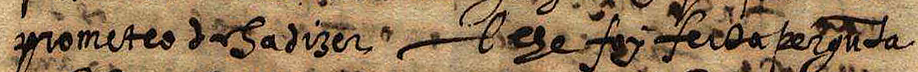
prometeo de ha dizer E lhe foy feita pergūta
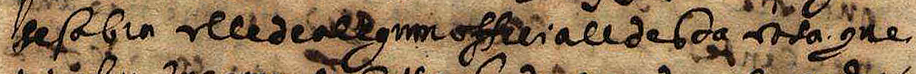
se sabia elle de allgum officiall desta casa que
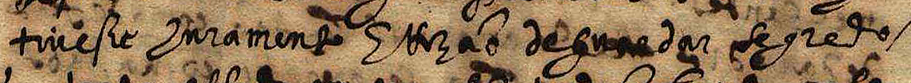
tiuesse Juramento E Rezaõ de guardar segredo /
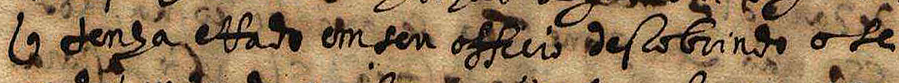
q̄ tenha eRado em seu officio descobrindo o se
